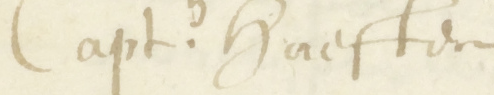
Captn. Haesten
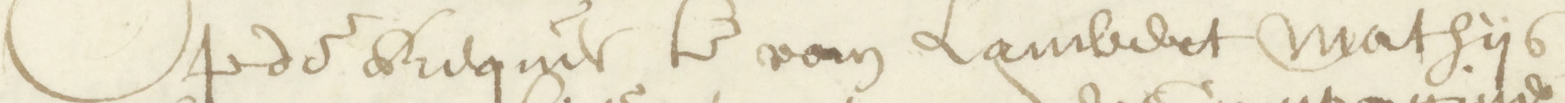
Opde Requeste van Lambert Mathijsz
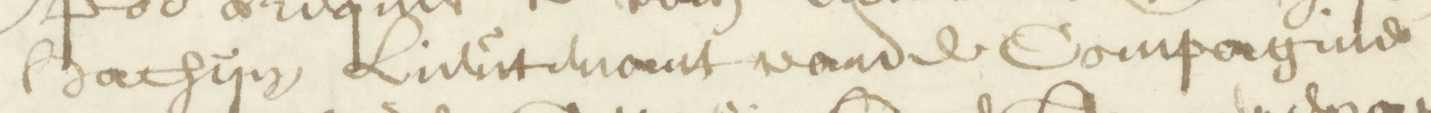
Hachijn, Lieutenant vande Compagnie
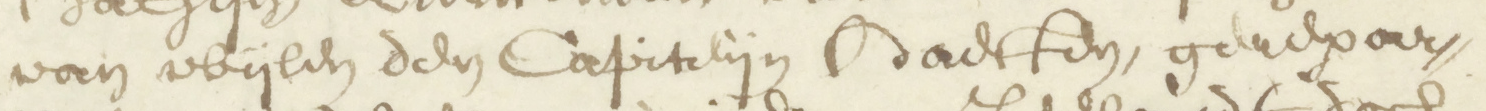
van wijlen den Capiteijn Haesten, gerepar,,
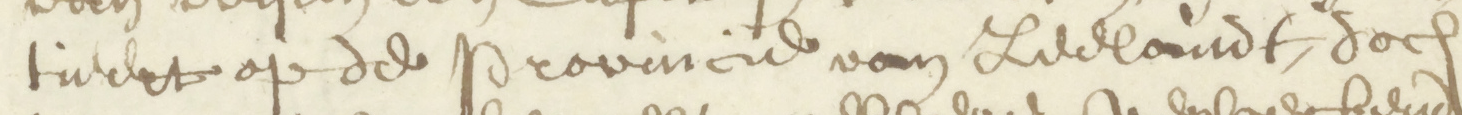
tieert op de Provincie van Zeelandt, doch
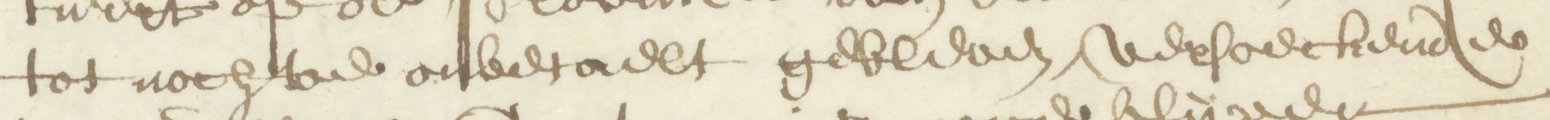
tot nochtoe onbetaelt gebleven, versoeckende
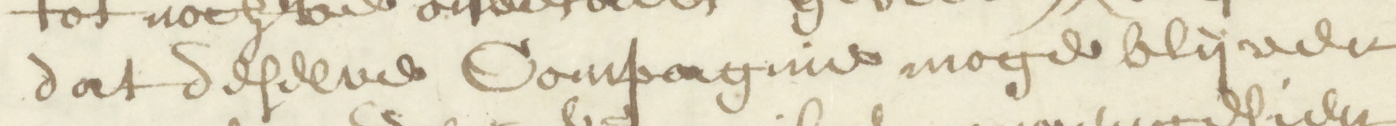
dat deselve Compagnie moge blijven
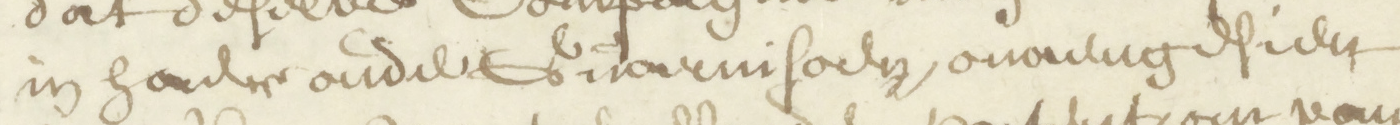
in haer oude Guarnisoen, onaengesien
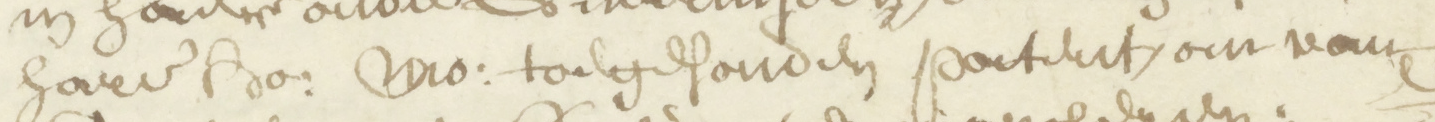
hare Ho:Mo: toegesonden patent, om van
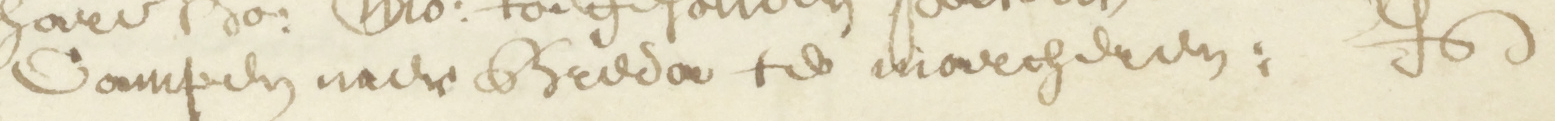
Campen naer Breda te marcheren: Is
